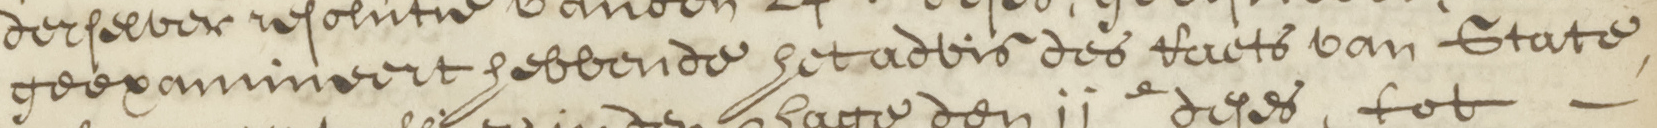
geexamineert hebbende het advis des Raets van State,
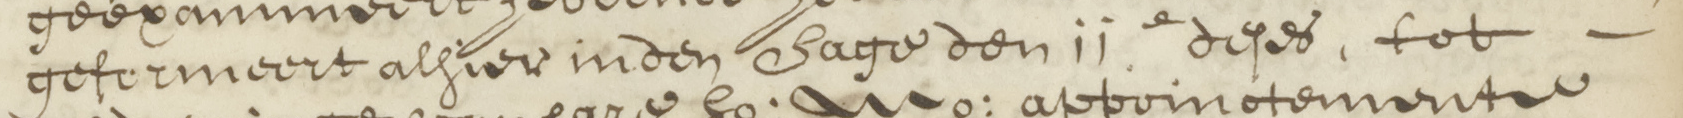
geformeert alhier inden Hage den ii .e deses, tot —
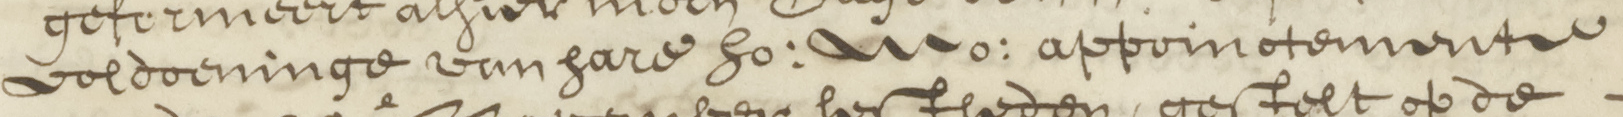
voldoeninge van hare ho:Mo: appoinctemente
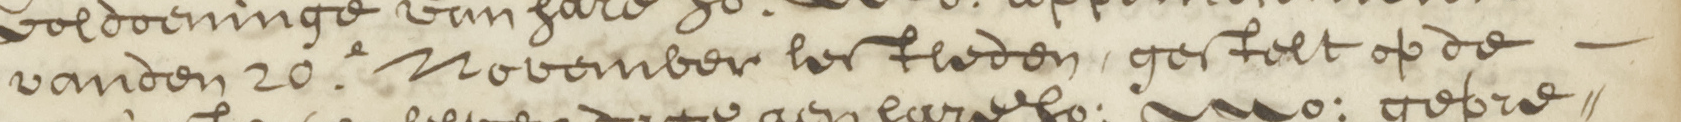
vanden 20 .e November lestleden, gestelt op de —
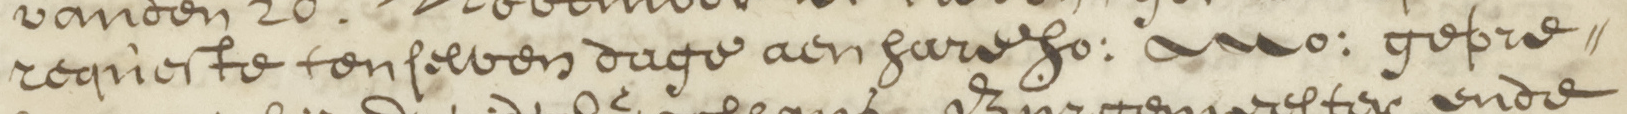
requeste ten selven dage aen hare ho:Mo: gepre„
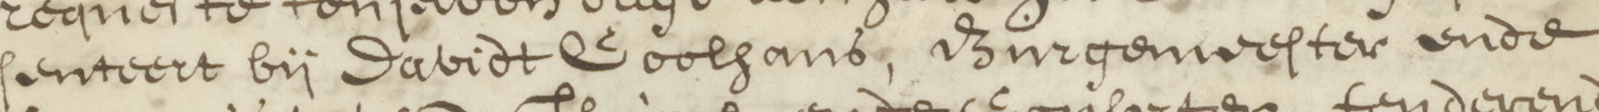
senteert bij Davidt Coolhans, Burgemeester ende
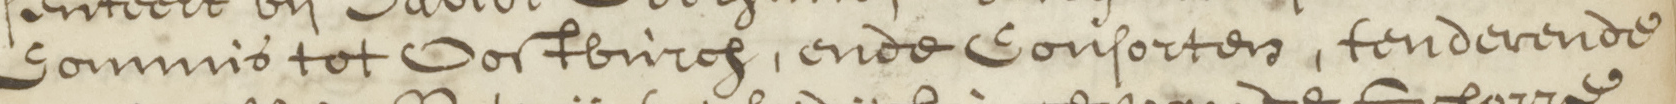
Commis tot Oostburch, ende Consorten, tenderende
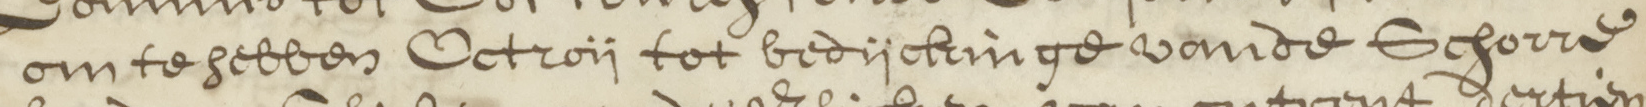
om te hebben Octroij tot bedijckinge vande Schorre
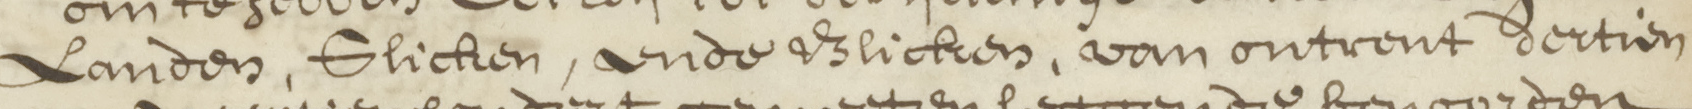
Landen, Slicken, ende Blicken, van ontrent dertien
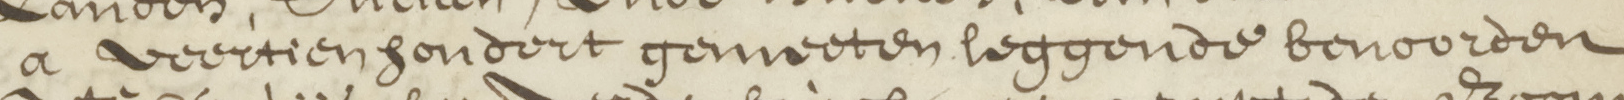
a veertien hondert gemeeten leggende benoorden
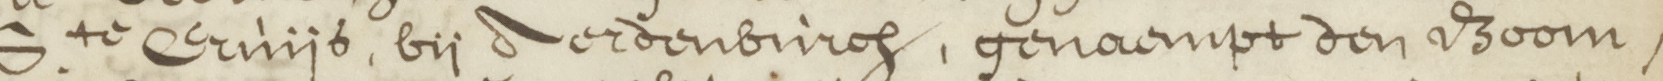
S.te Cruijs, bij Aerdenburch, genaempt den Boom,
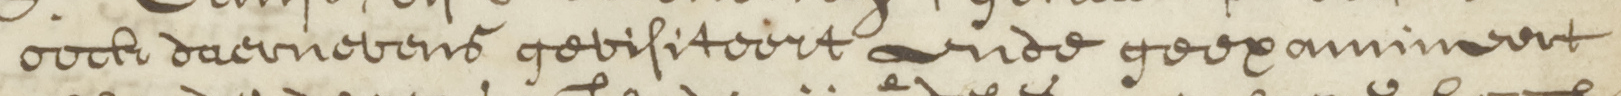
oock daernevens gevisiteert ende geexamineert
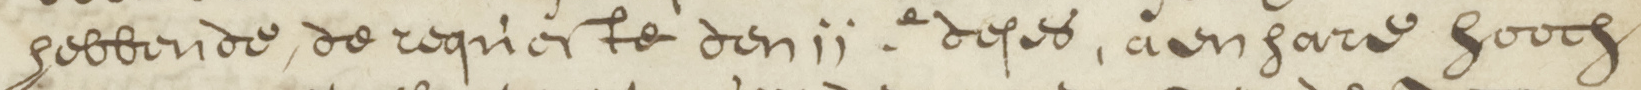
hebbende, de requeste den ii .e deses, aen hare hooch
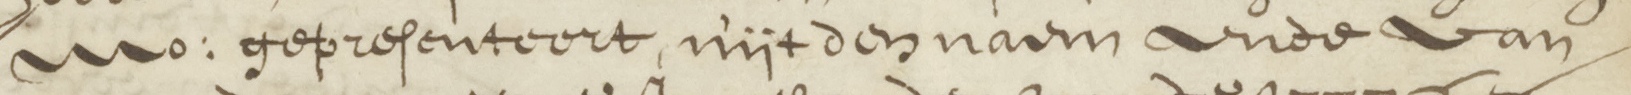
Mo: gepresenteert uijt den naem ende van
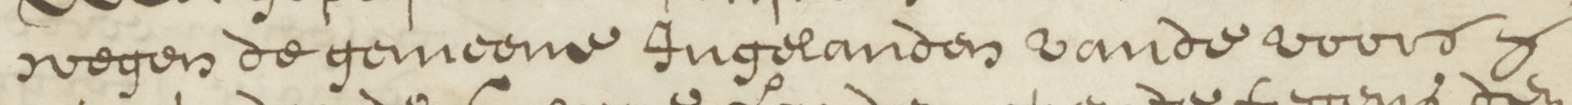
wegen de gemeene Ingelanden vande voorsz
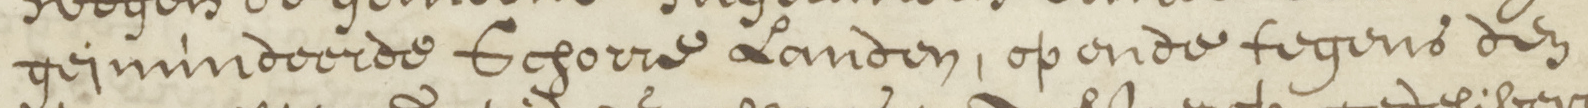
geinundeerde Schorre Landen, op ende tegens den
